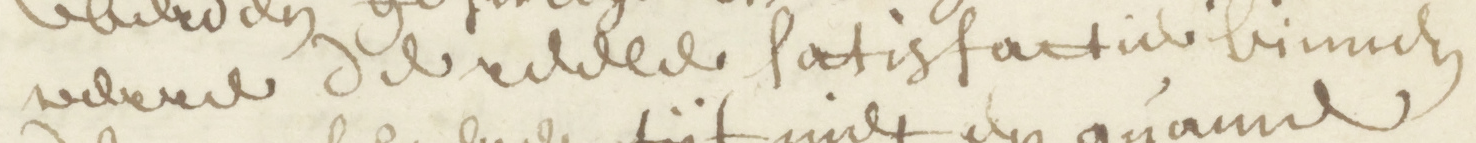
verre de veele satisfactie binnen
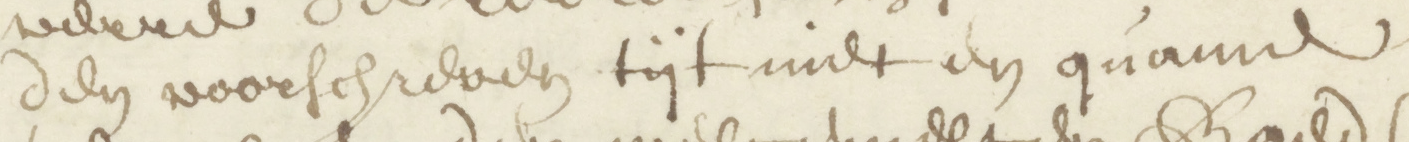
den voorschreven tijt niet en quame
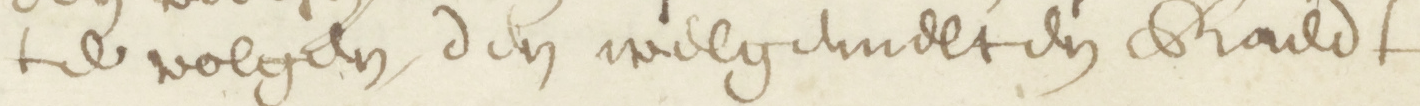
te volgen, den welgemelten Raedt
